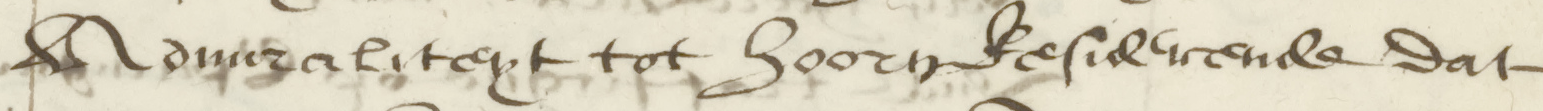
Admiraliteyt tot Hoorn Residerende dat
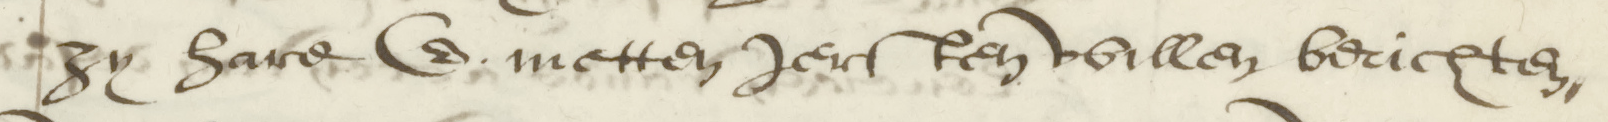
zy hare E. metten Iersten willen berichten,
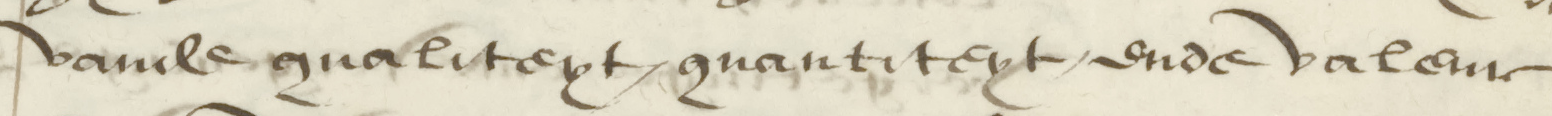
vande qualiteyt, quantiteyt, ende valeur
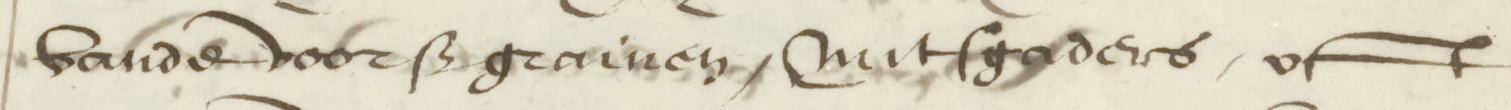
vande voorsz grainen, mitsgaders, off
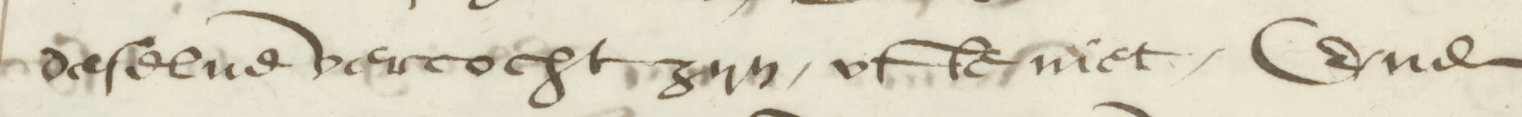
deselue vercocht zyn, ofte niet. Ende
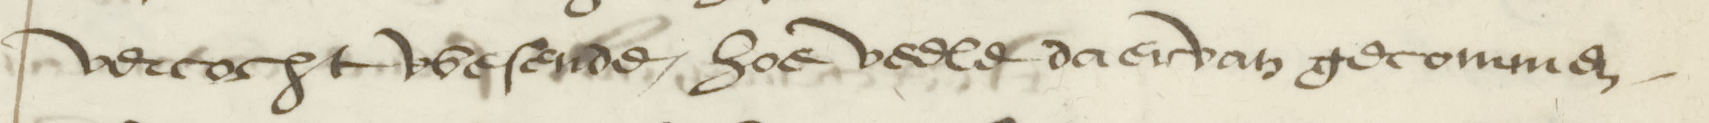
vercocht wesende, hoe veele daervan gecommen,
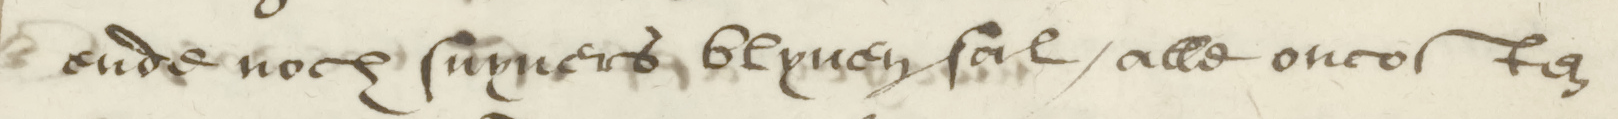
ende noch suyuers blyuen sal, alle oncosten
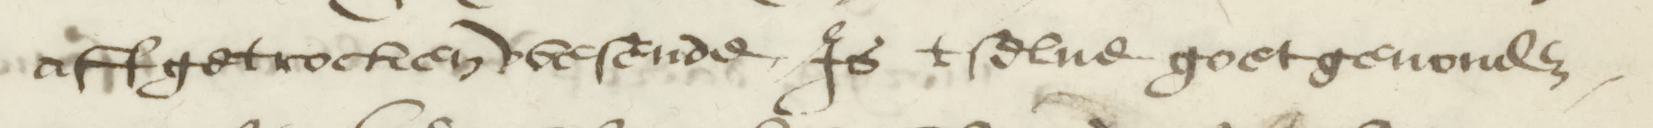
affgetrocken wesende. Is tselue goetgeuonden,
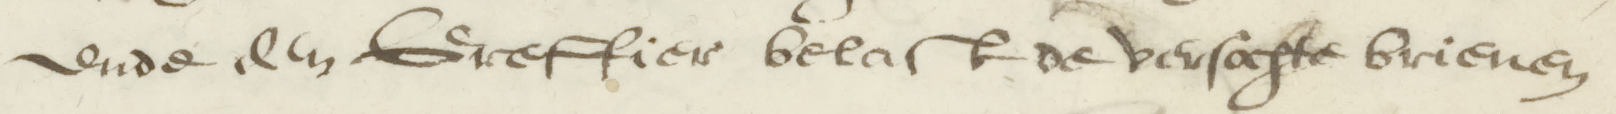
ende den Greffier belast de versochte brieuen
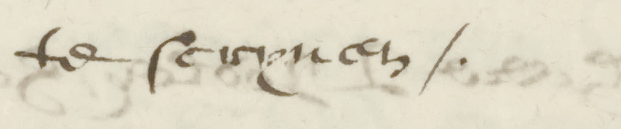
te scryuen.
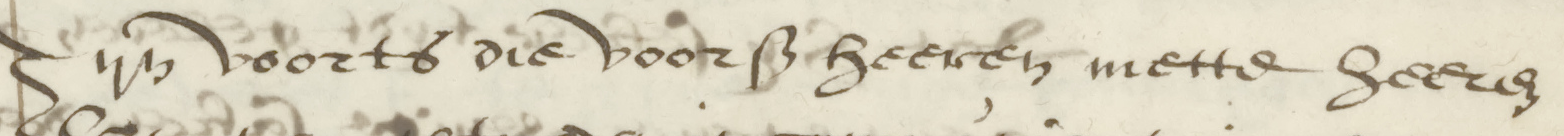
Zyn voorts die voorsz heeren mette heeren
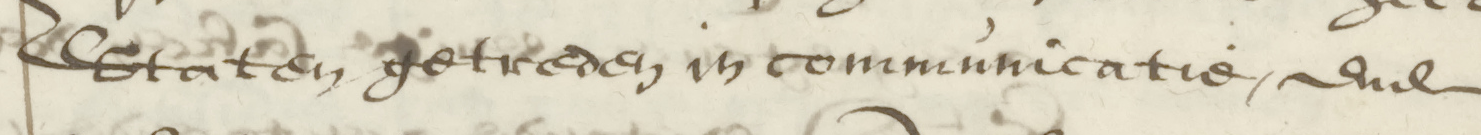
Staten getreden in communicatie, ende
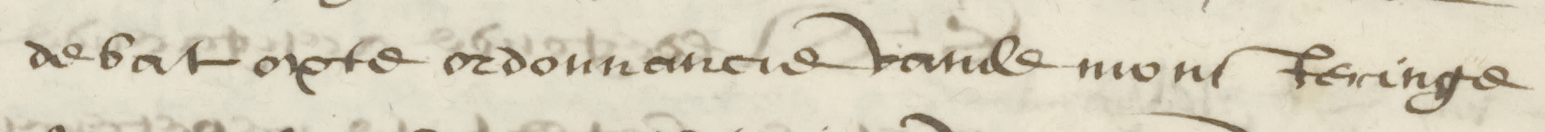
debat opte ordonnancie vande monsteringe
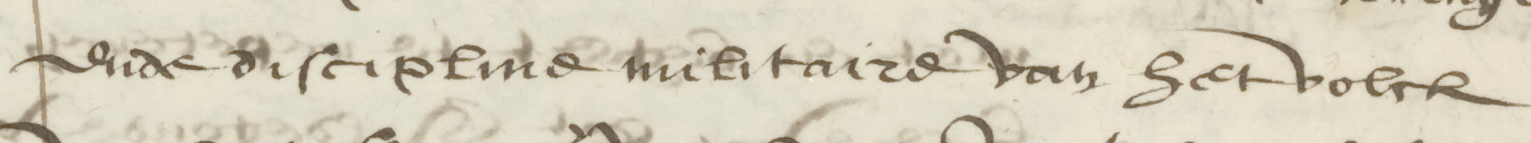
ende discipline militaire van het volck
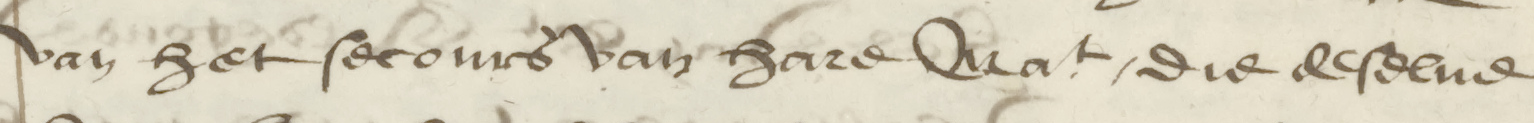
van het secours van hare Mat., die deselue
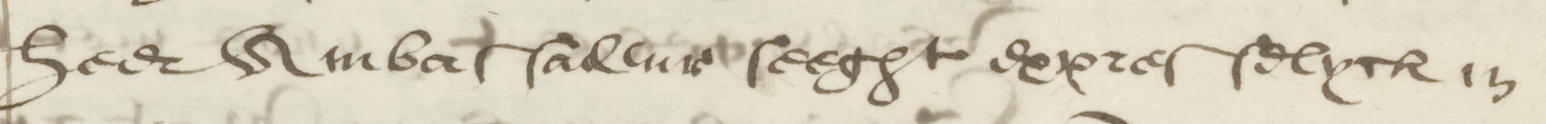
heer Ambassadeur seeght expresselyck in
